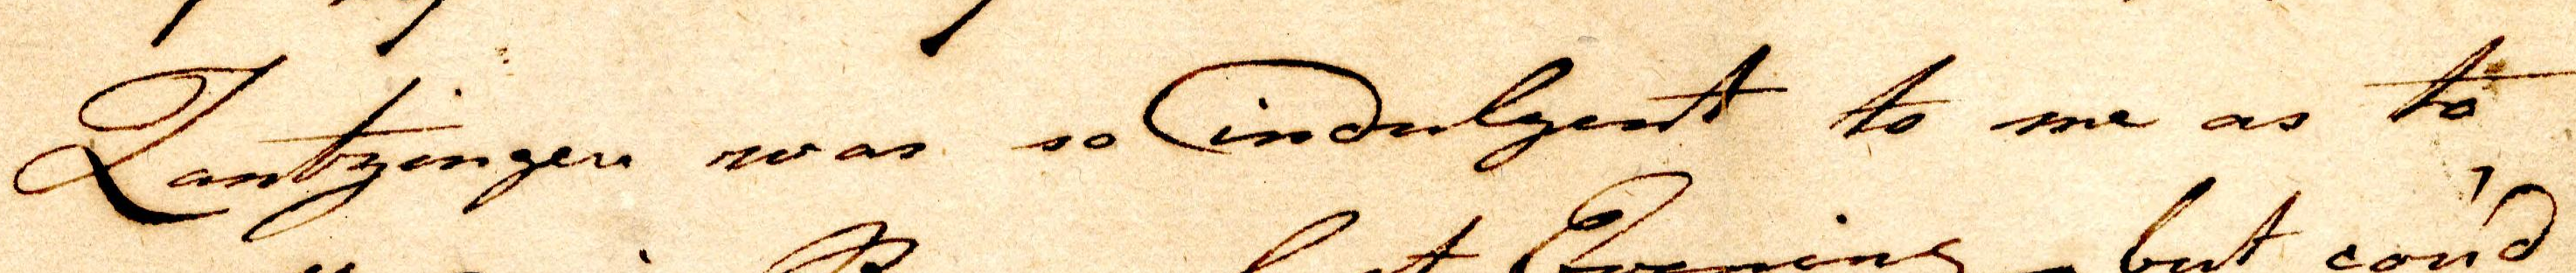Zantzinger was so indulgent to me as to
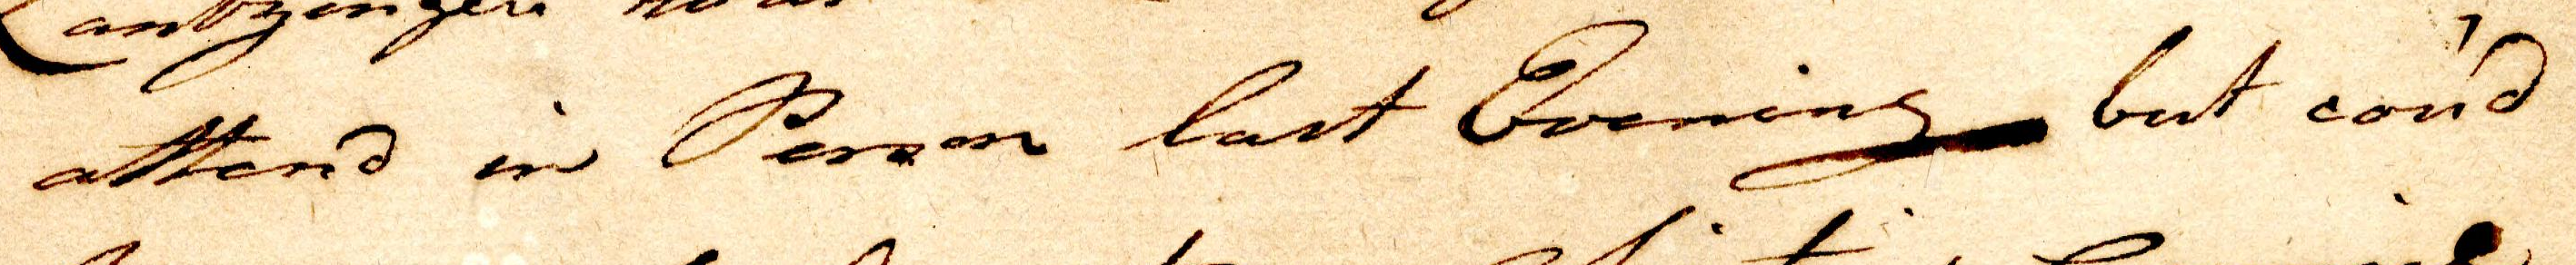attend in Person last Evening but cou'd
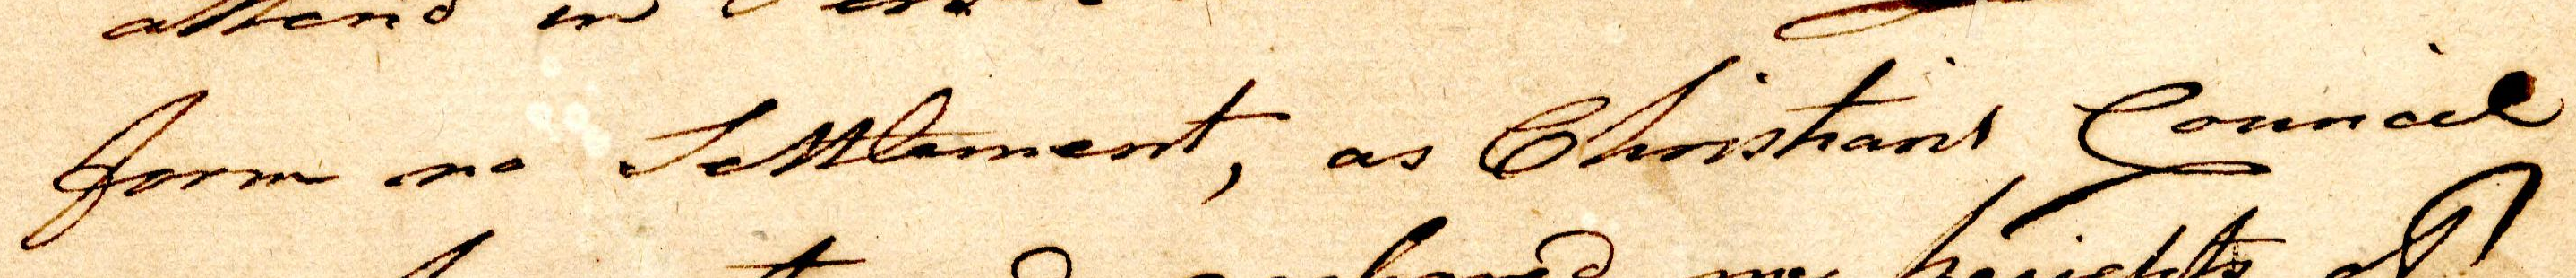form no Settlement, as Christians Council
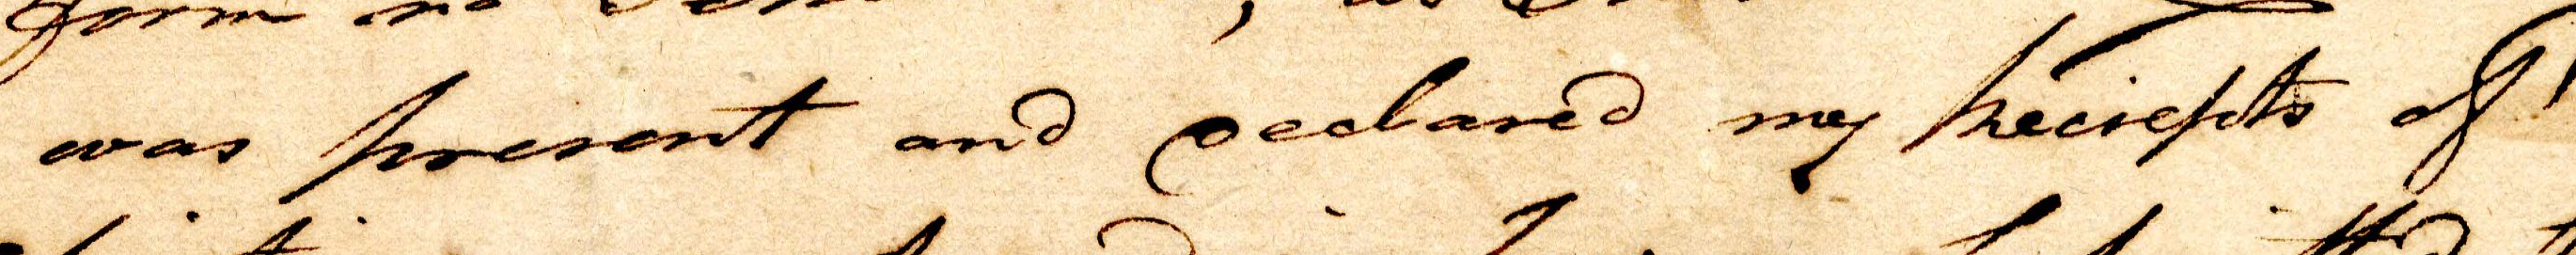was present and declared my Reciepts of
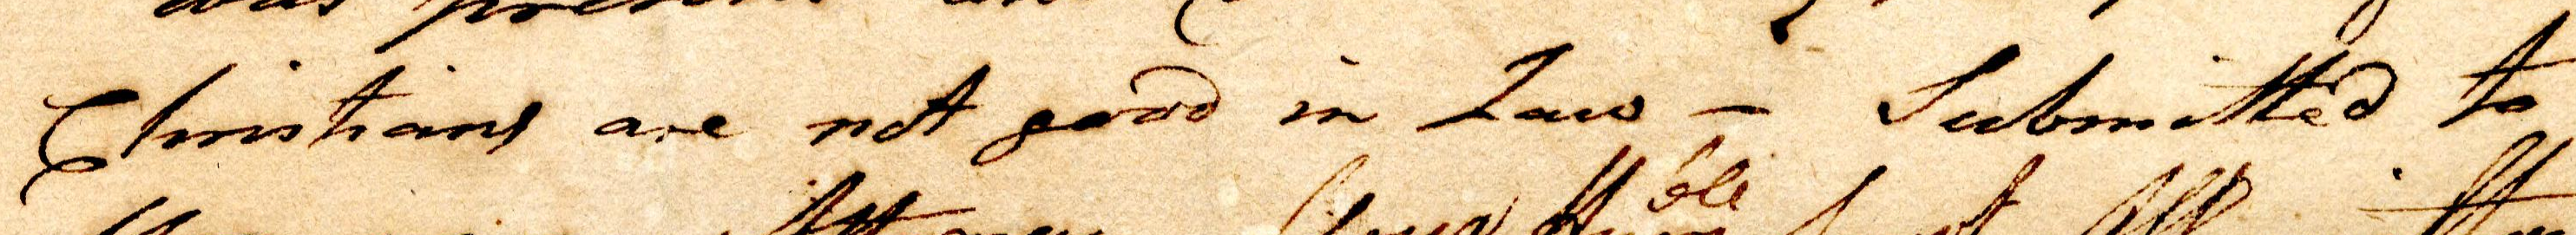Christians are not good in Law. Submitted to
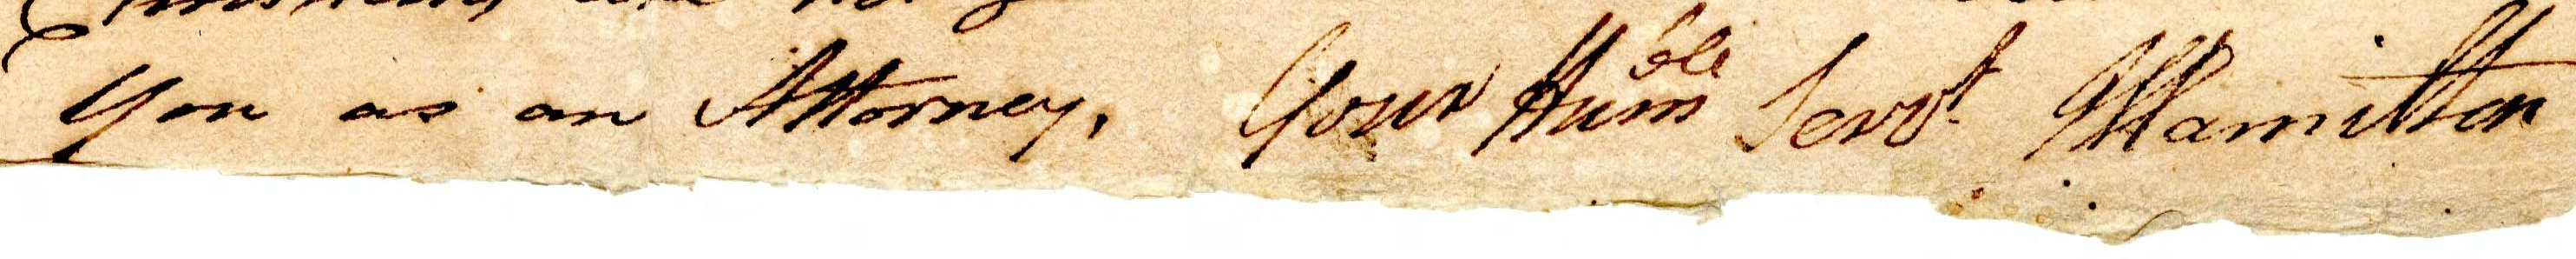You as an Attorney, Your Hum^ble Serv^t J. Hamilton
